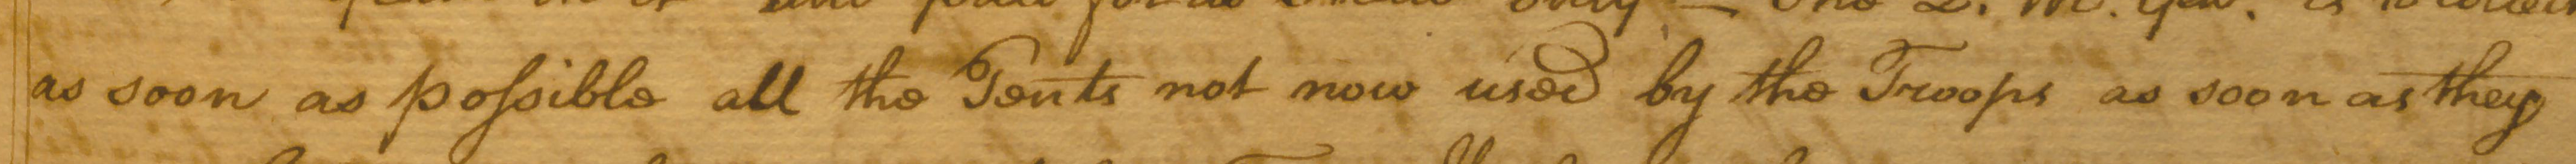as soon as possible all the Tents not now used by the Troops as soon as they
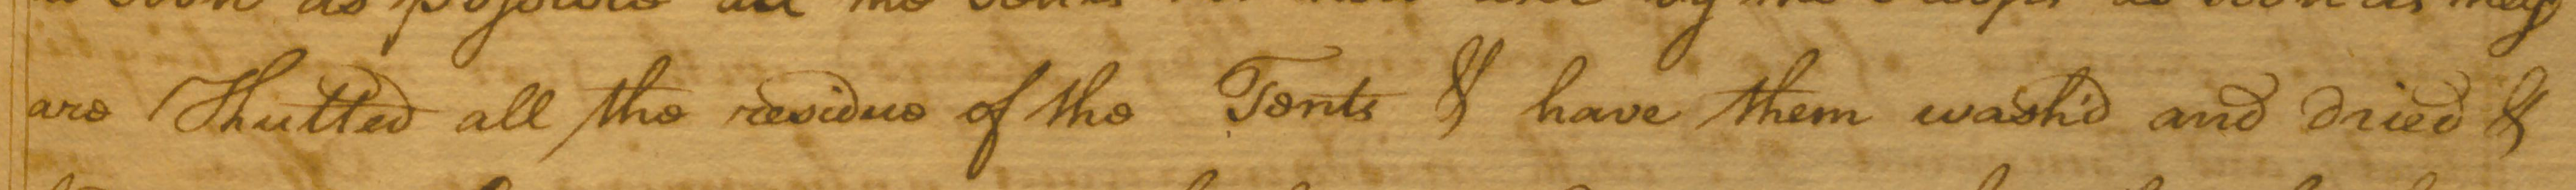are Hutted all the residue of the Tents & have them wash'd and dried &
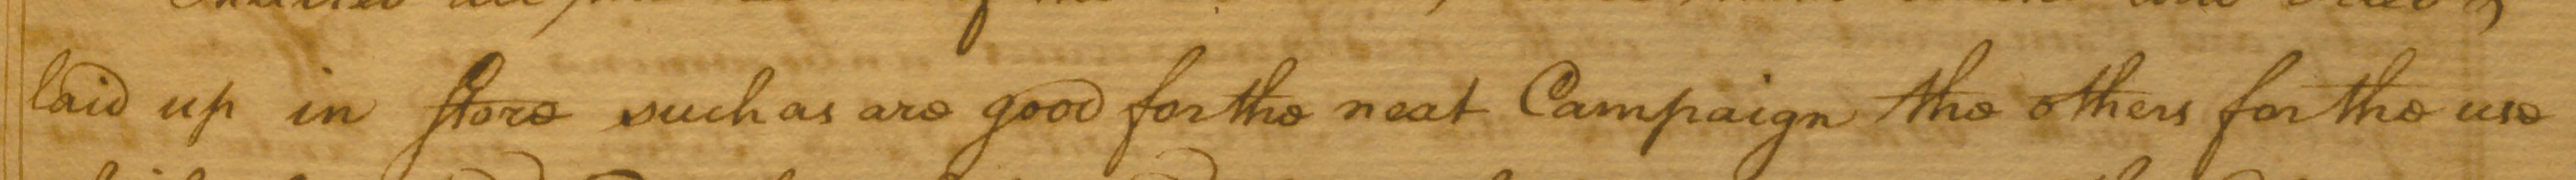laid up in the store such as are good for the next Campaign tho others for the use
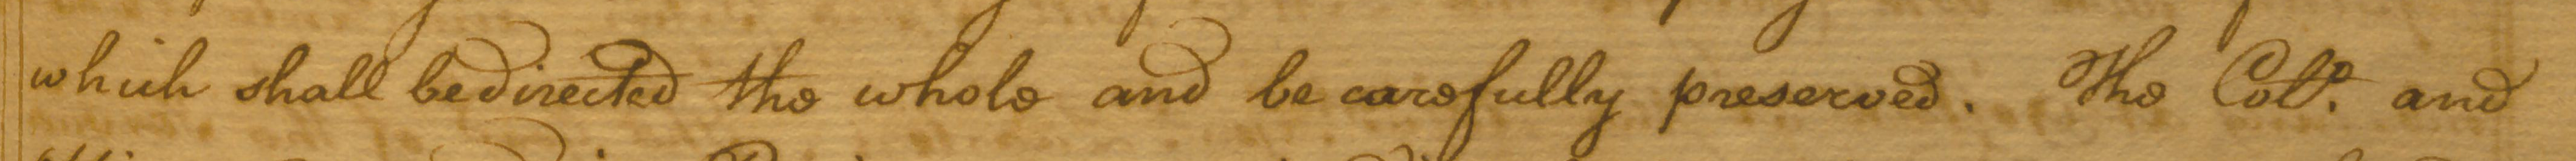which shall be directed the whole and be carefully preserved. The Col^o. and
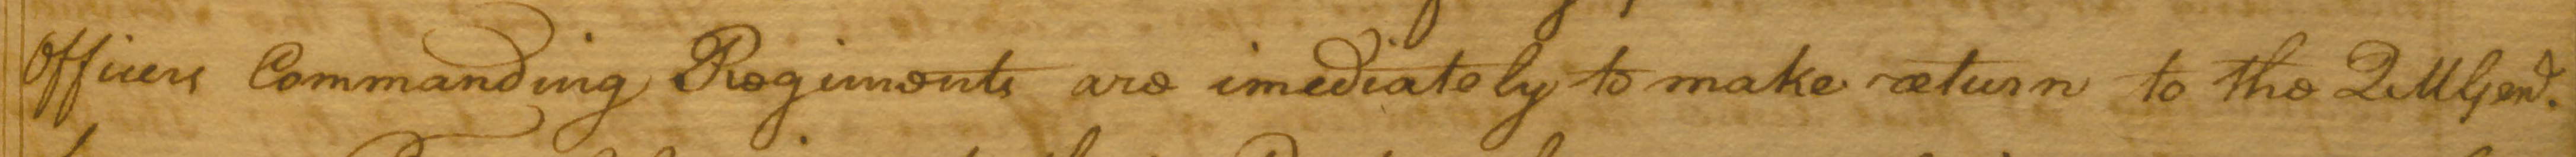Officers Commanding Regiments are immediately to make return to the QMGen^l.
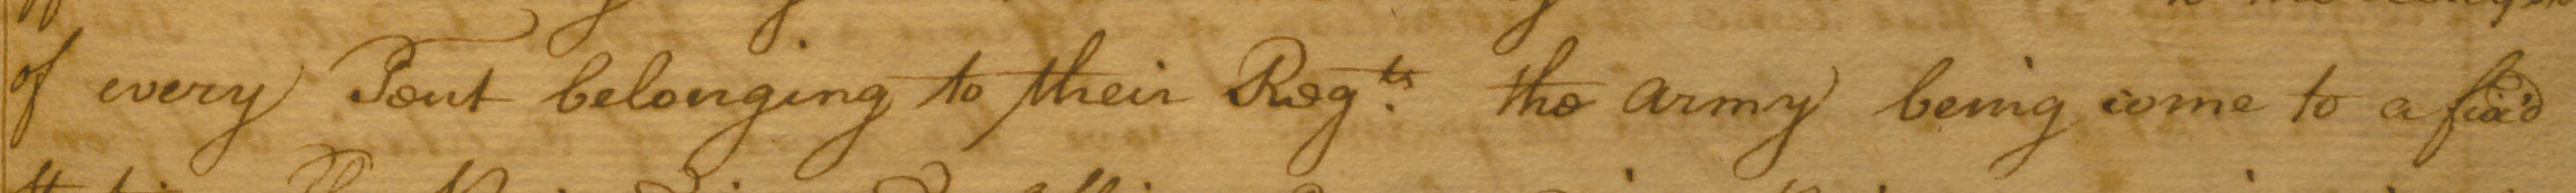of every Part belonging to their Reg^ts. the army being come to a fix'd
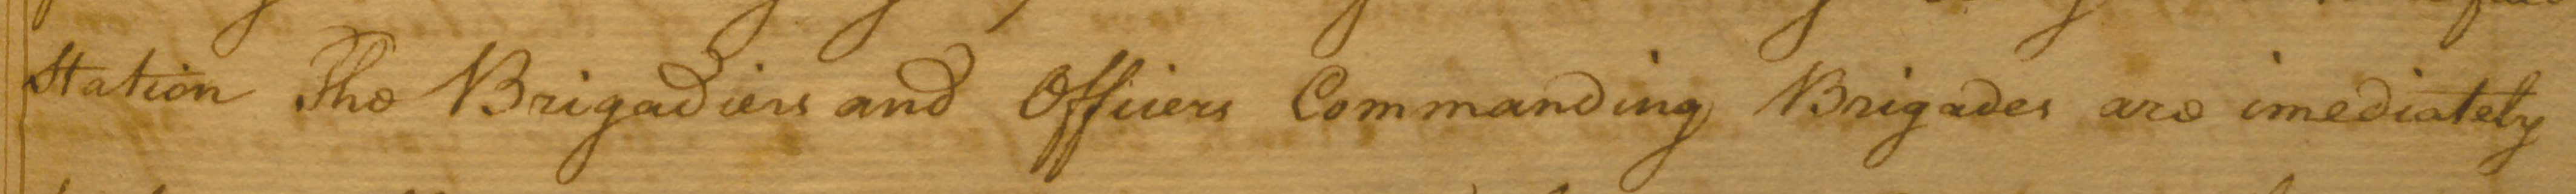station The Brigadiers and Officers Commanding Brigades are immediately
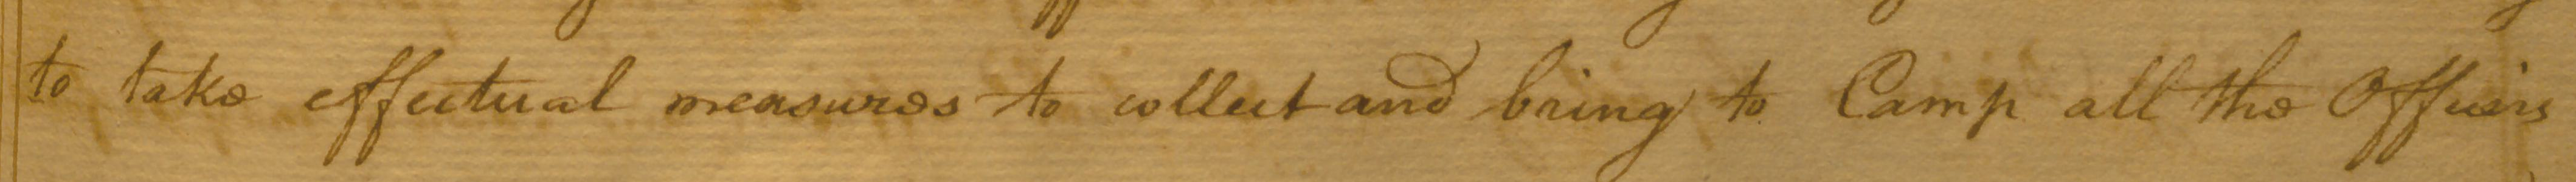to take effectual measures to collect and bring to Camp all the Officers
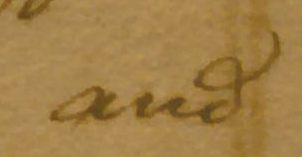and
